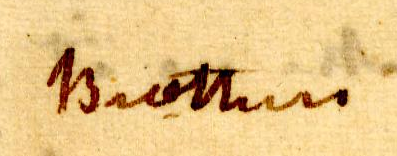Brothers
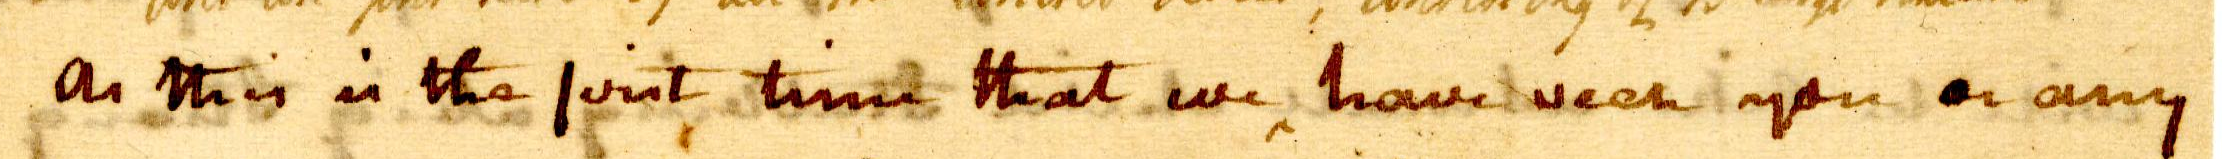As this is the first time that we have seen you or any
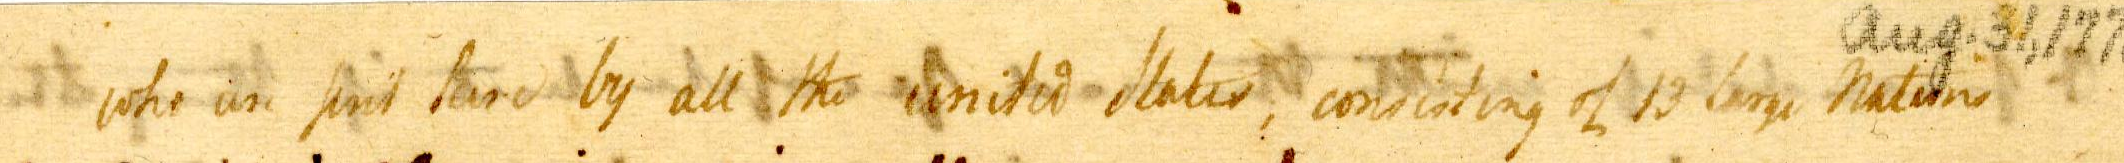who are put here by all the united states, consisting of 13 large Nations
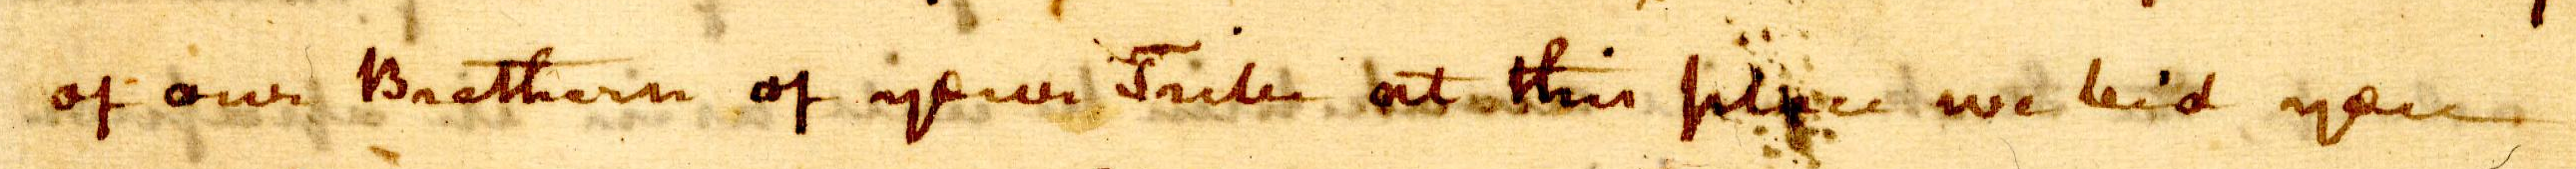of our Brethern of your Tribe at this place we bid you
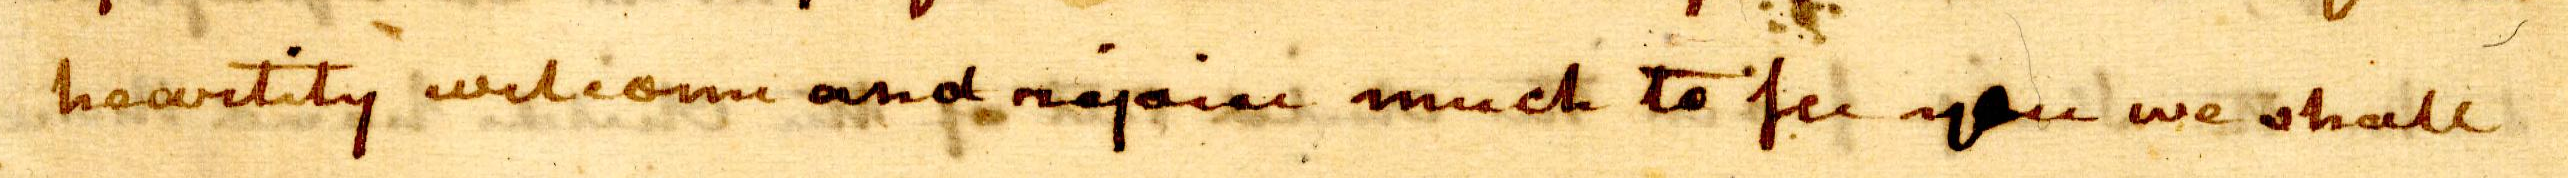heartily welcome and rejoice much to see you we shall
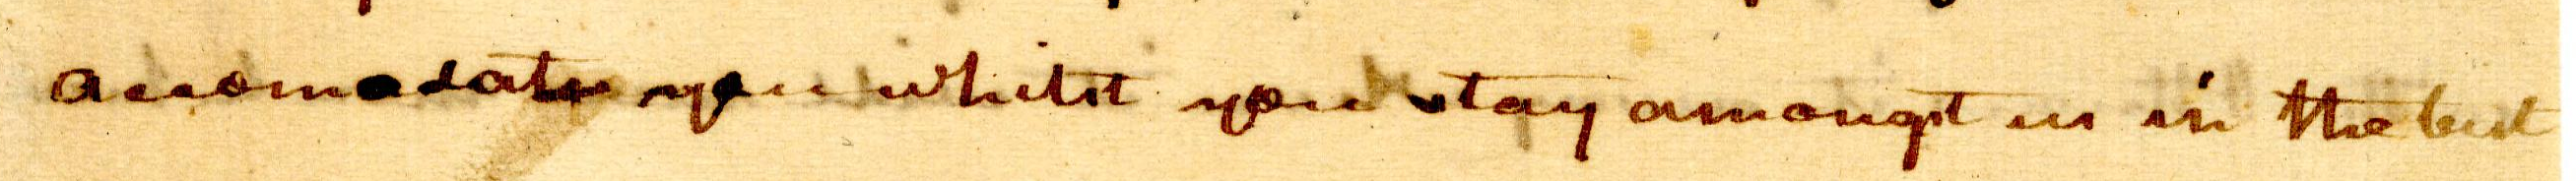accomodate you while you stay amongst us in the best
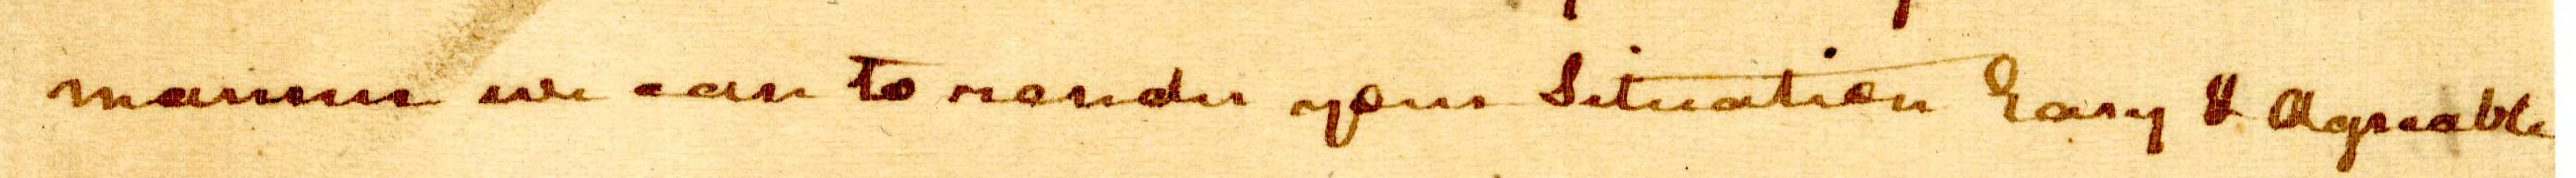manner we can to render your Situation Easy & Agreable
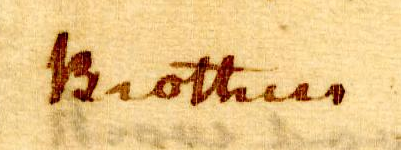Brothers
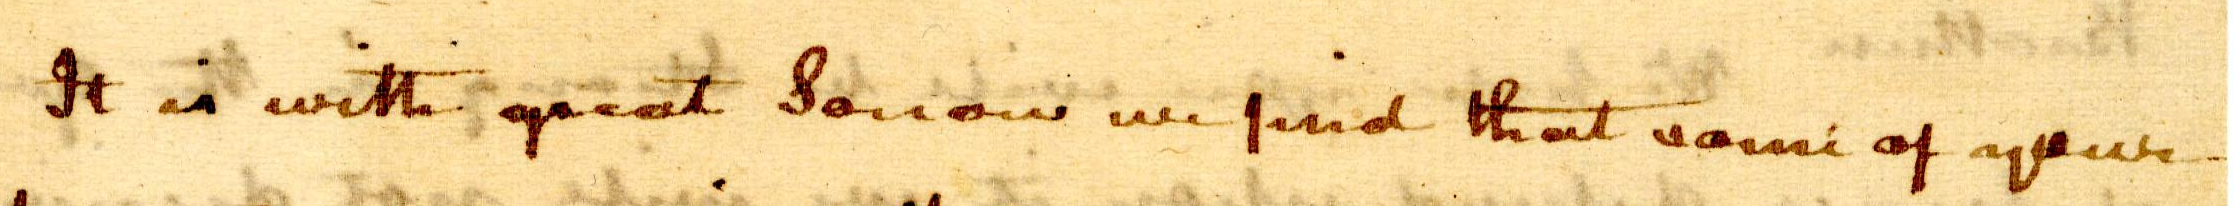It is with great Sorrow we find that some of your
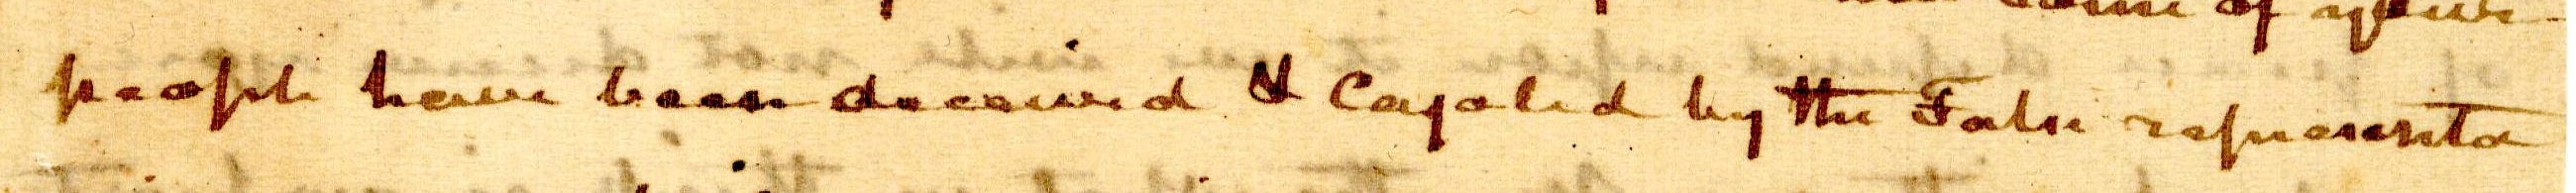people have been deceived & Cajoled by the False representa
